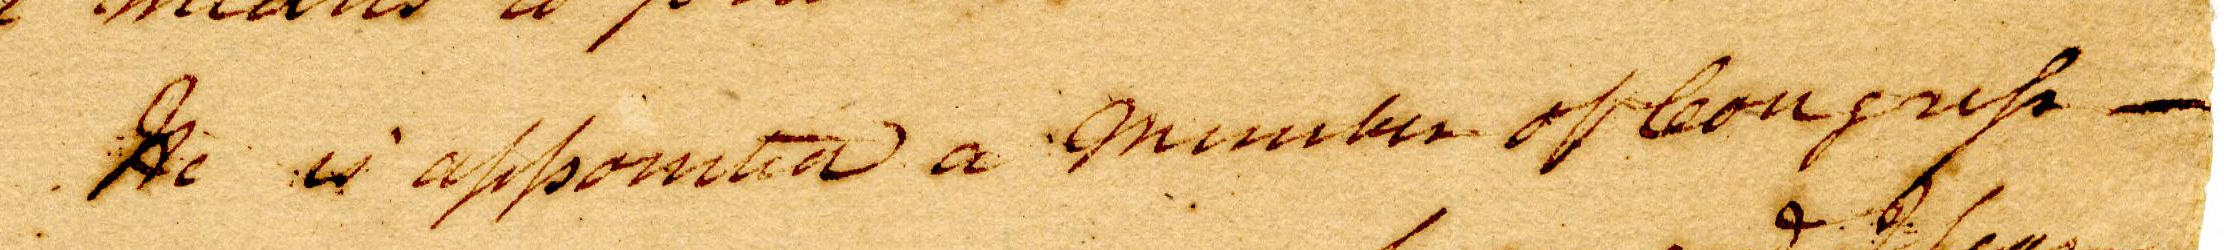He is apponted a member of Congress.
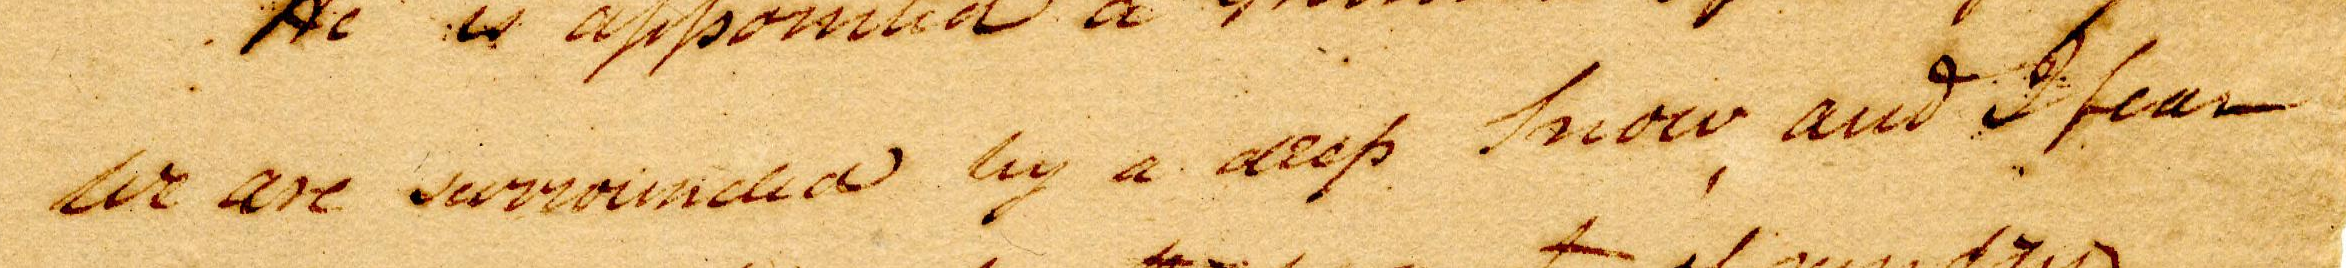we are surrounded by a deep snow and I fear
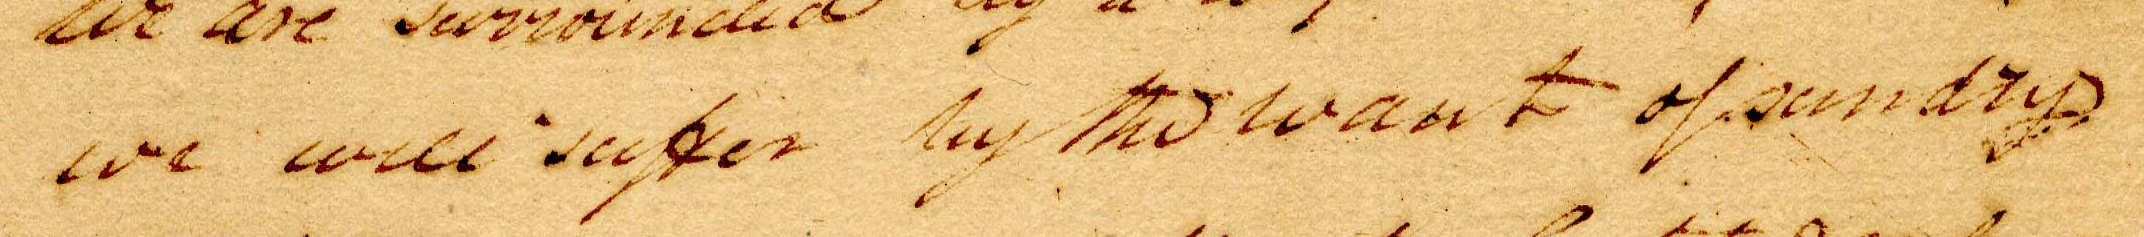we will suffer by the want of sundry
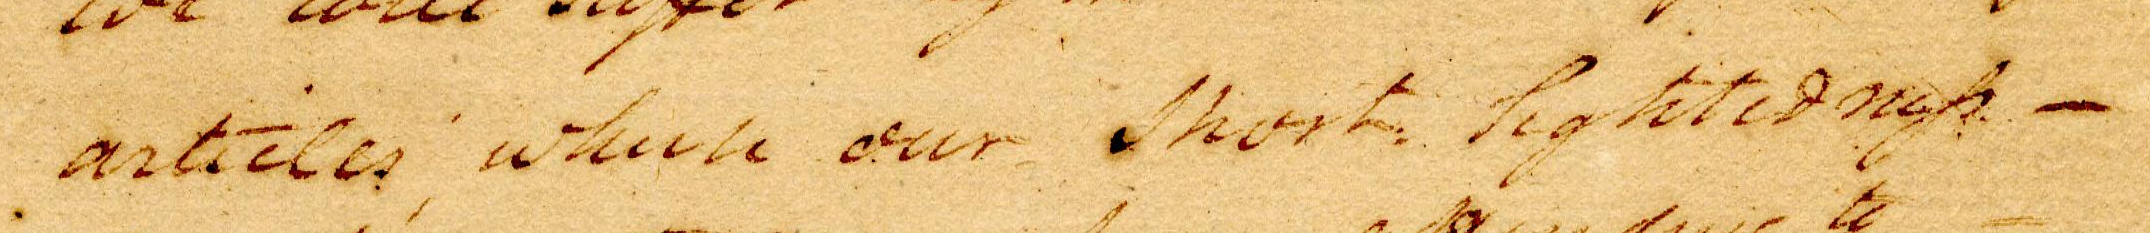articles which our short sightedness.
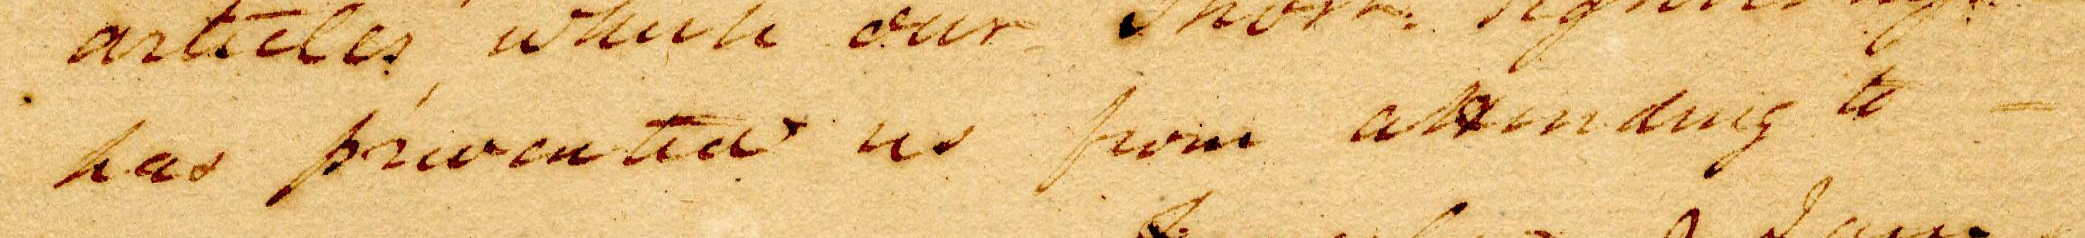has prevented us from attending to
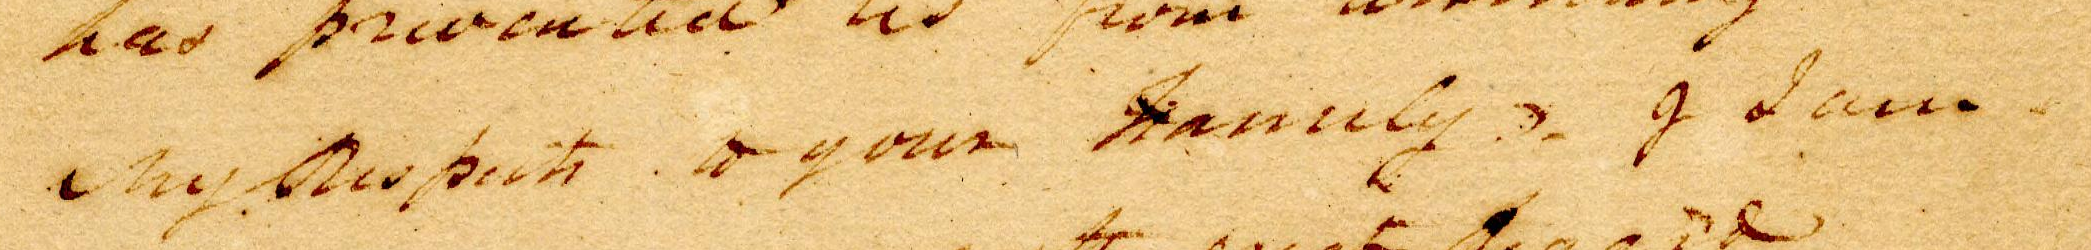my Respects to your family. I am
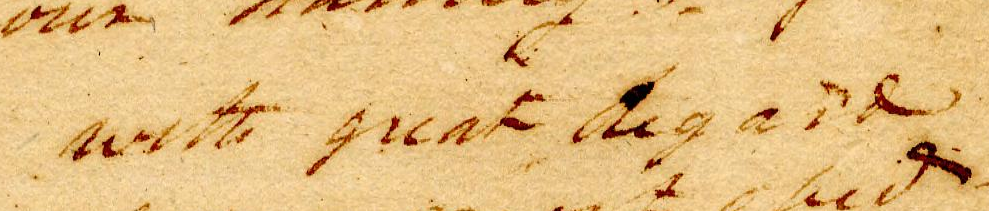with great Regard
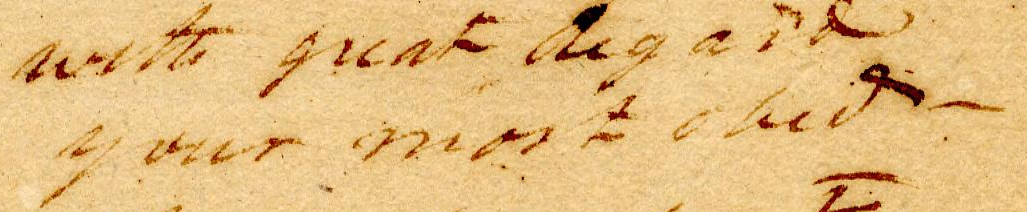your most obed^t
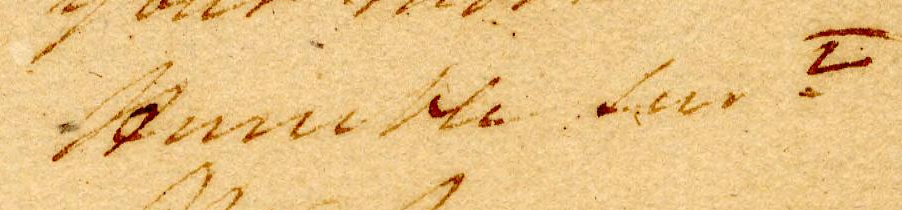Humble Serv^t
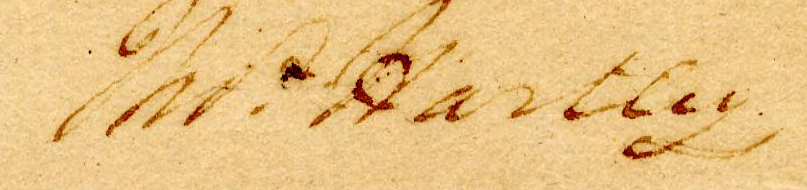Tho^s. Hartley
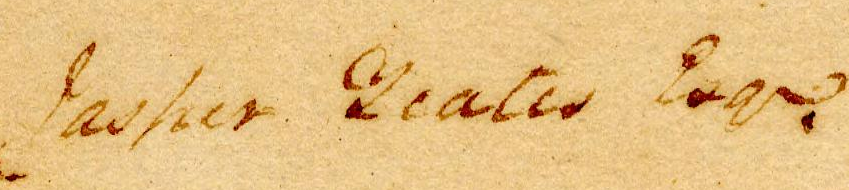Jasper Yeates Esq^r
